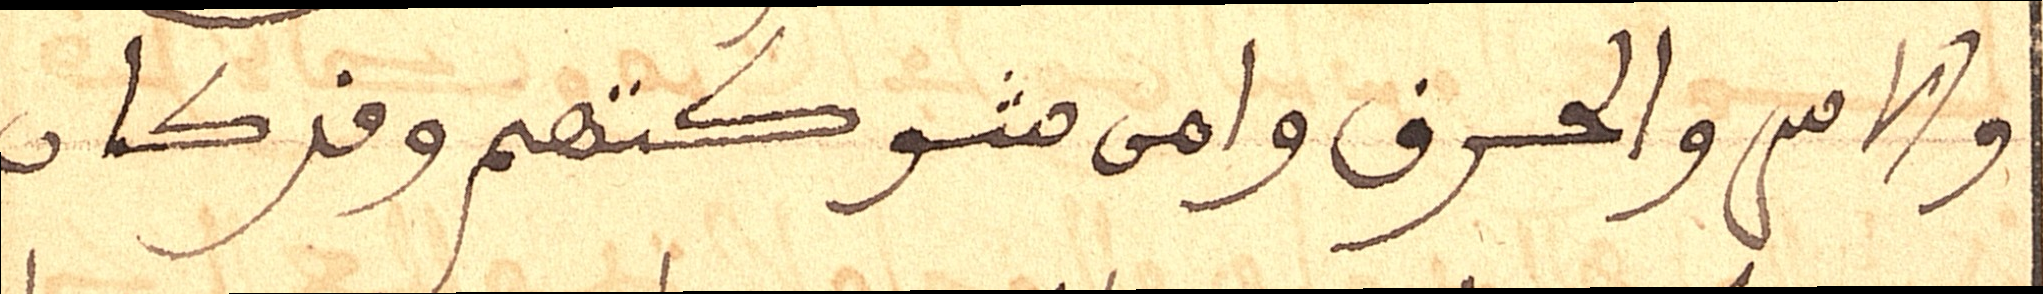والاسروالحرق وامن شوكتهم وقد كان
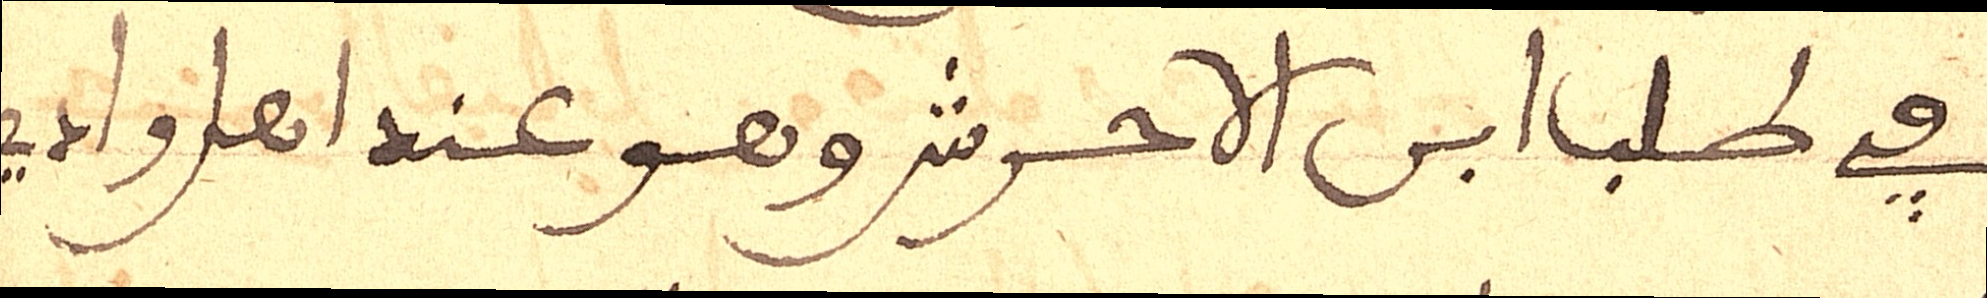في طلب ابن الاحرش وهو عنه اهل وادي
